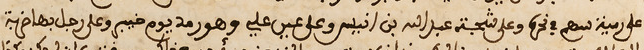على رمية سهم في نحره وعلى شجة عبد الله بن نيس وعلى عين علي وهو رمد يوم خيبر وعلى رجل بها خربة
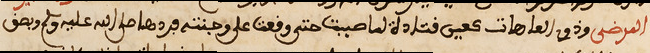المرضى وذوح العاهات كعين قتادة لما صيت حتى وقعت على وجنته فردها صلى الله عليه وسلم وبصق
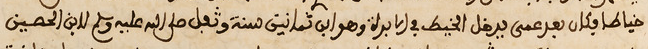خياطا فكان بعد عمى يرخل الخيط في الابدة وهو ابن ثمانين سنة وثفل صلى الله عليه وسلم لابن الحصين
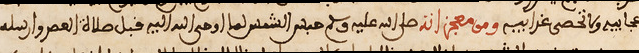عجابيه ولا تحصى غرابيه ومن معجز اته صلى الله عليه وسلم حبس الشمس لما اوحى الله اليه قبل صلاة العصر وارسله
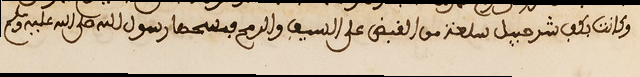وكانت بكف شرحبيل سلعة من القبض على السيف والرمح فمسحها رسول الله صلى الله عليه وسلم
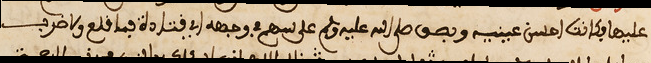عليها فكانت احسن عينيه وبصق صلى الله عليه وسلم على سهم في وجهه اي قتادة فما قلع ولا ضرب
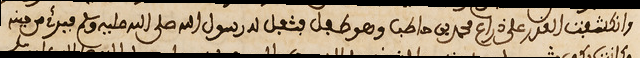وانكشفت العدر على ذراع محمد بن حاطب وهو طفل فثفل له رسول الله صلى الله عليه وسلم فبرى من حينه
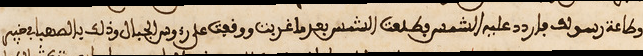وطاعة رسولك فاردد عليه الشمس فطلعت الشمس بعد ما غربت ووقفت على رءوس الجبال وذلك بالصهبا في خير
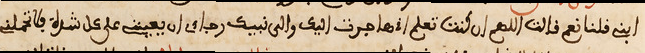ابنى قلنا نعم قالت اللهم ان كنت تعلم انى هاجرت اليك والى نبيك رجاءى ان يعيتى على كل شدة فلا تحملنى
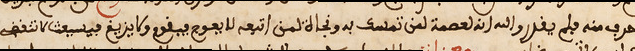حرف منه فلم يقرر والله انه لعصمة لمن تمسك به ونجاة لمن اتبعه لا يعوج فيقوم ولا يزيغ فيسيعث لا تنغضى
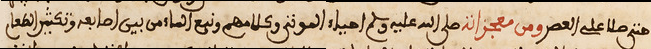حتى صلا على العصر ومن معجزاته صلى الله عليه وسلم احياء الموتى وكلامهم ونبع الماء من بين اصابعه وتكثير الطعام
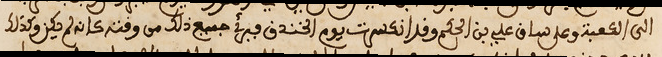الى الكعبة وعلى ساق علي بن الحكم وقد انكسرت يوم الخندق فبرى جميع ذلك من وقته كانه لم يكن وكذلك
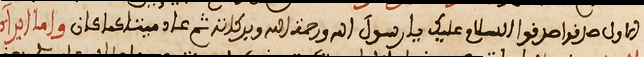الاول صرقوا صرقوا السلام عليك يا رسول الله ورحمة الله وبركاته ثم عاد ميتا كما كان واما ايرء
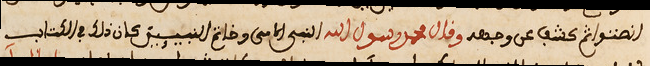انصتوا ثم كشف عن وجهه وقال محمد رسول الله البنى الامى وخاتم النبيئن كان ذلك في الكتاب
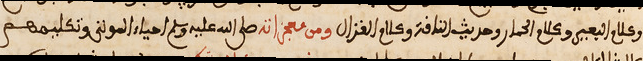وكلام البعير وكلام الحمار وحديث الناقة وكلام الغزال ومن معجزاته صلى الله عليه وسلم احياء المولنى وتكليمهم
